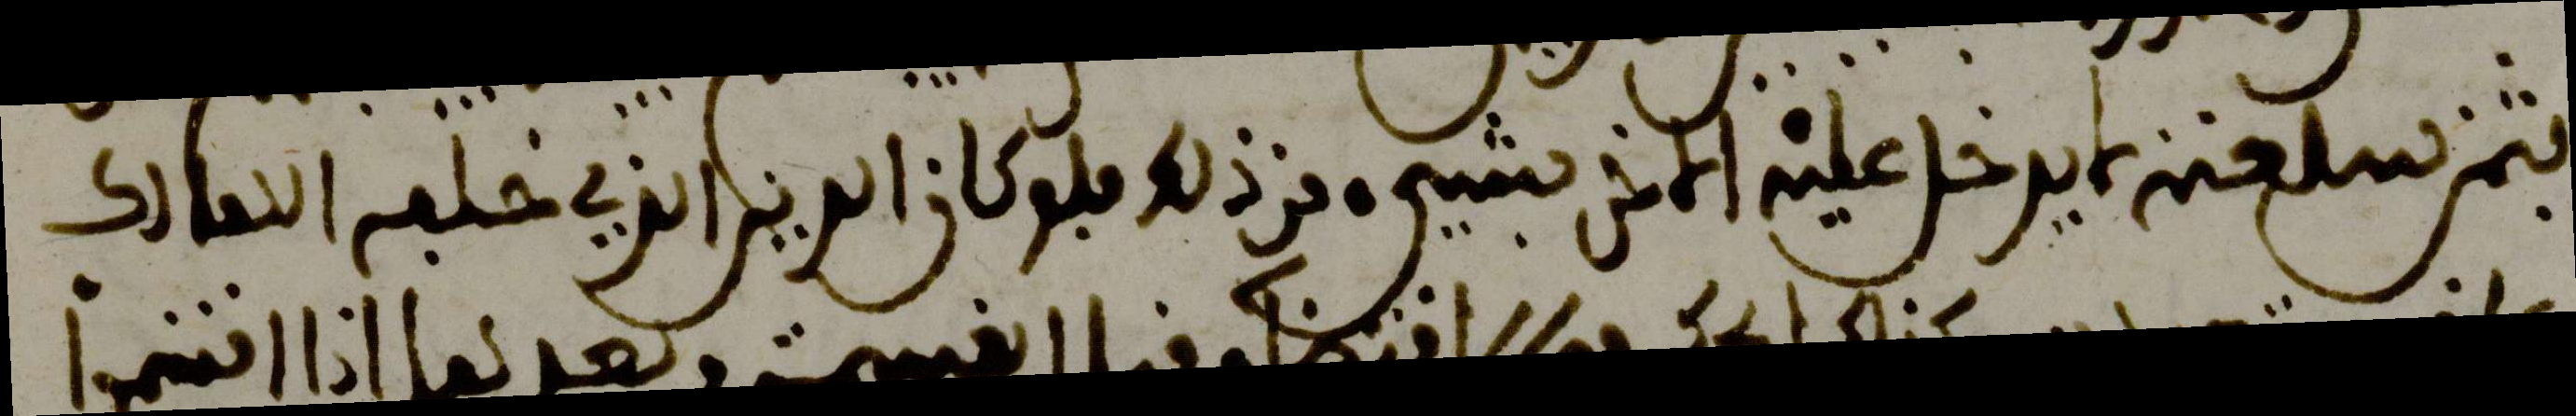بثمن سلعته لا يدخل عليْه الاخر بشيء من ذلك فلو كان الدين الذي خلفه الهالك
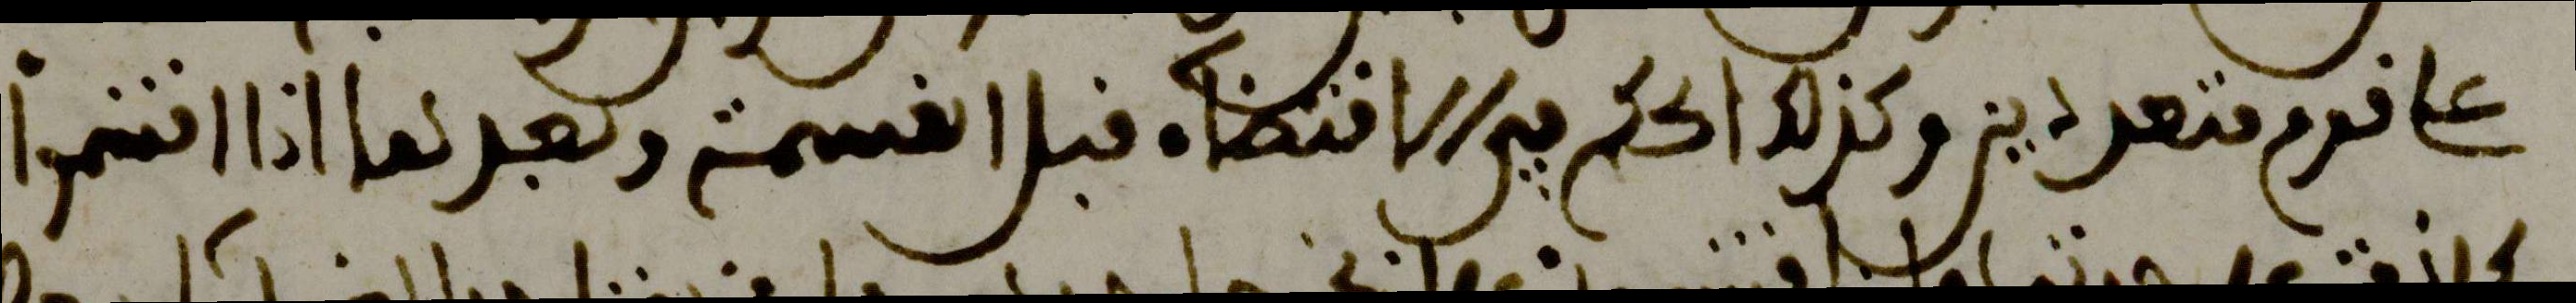على قوم متعددين وكذلك الحكم في الاقتضاء قبل القسمة وبعدها اذا اقتسموا
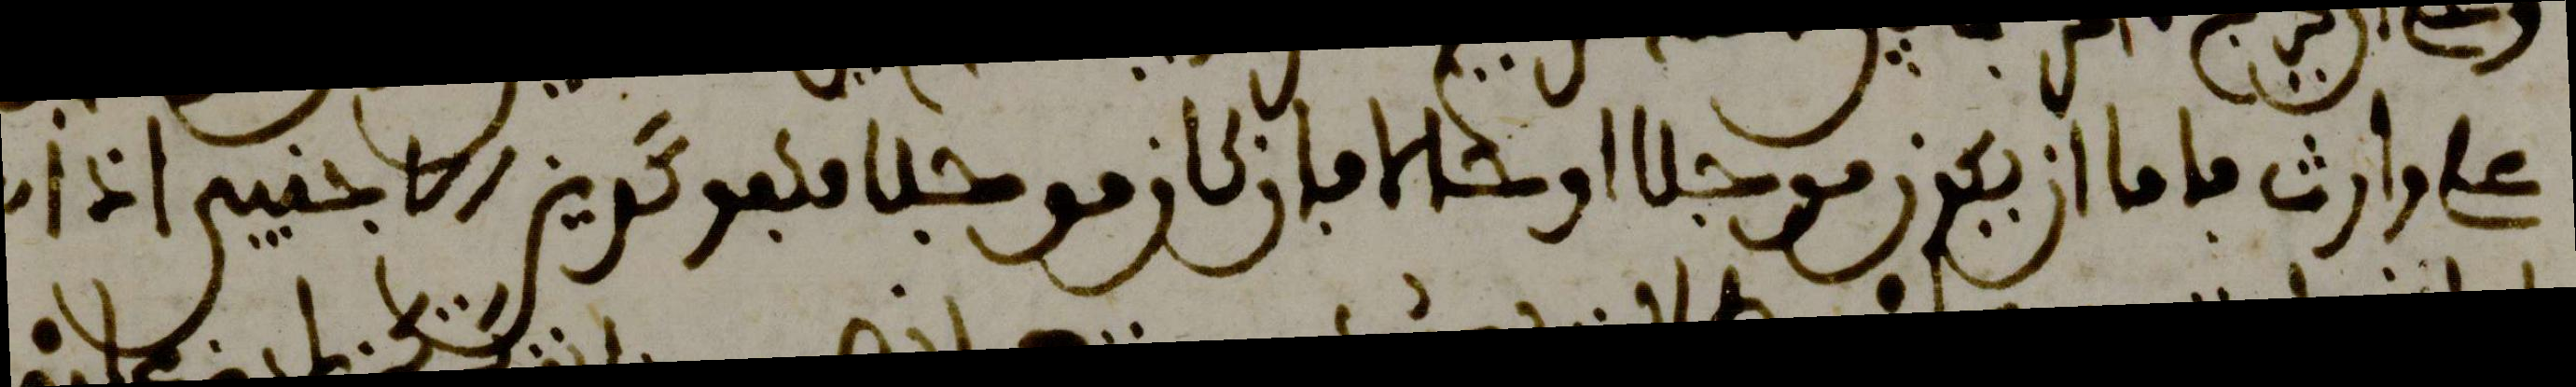على وارث فاما ان يكون موجلا او حالا فان كان موجلا فهو كدين الاجنبي اذا
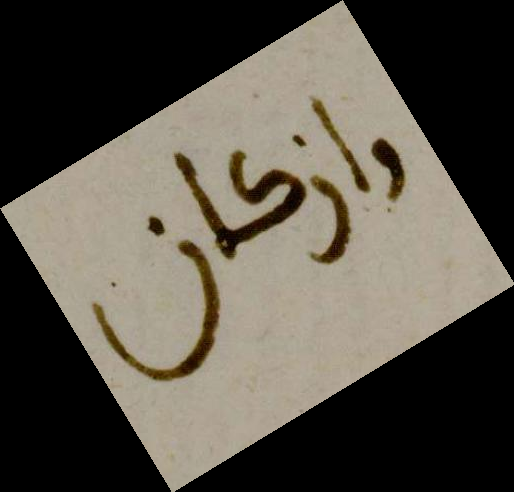و ان كان
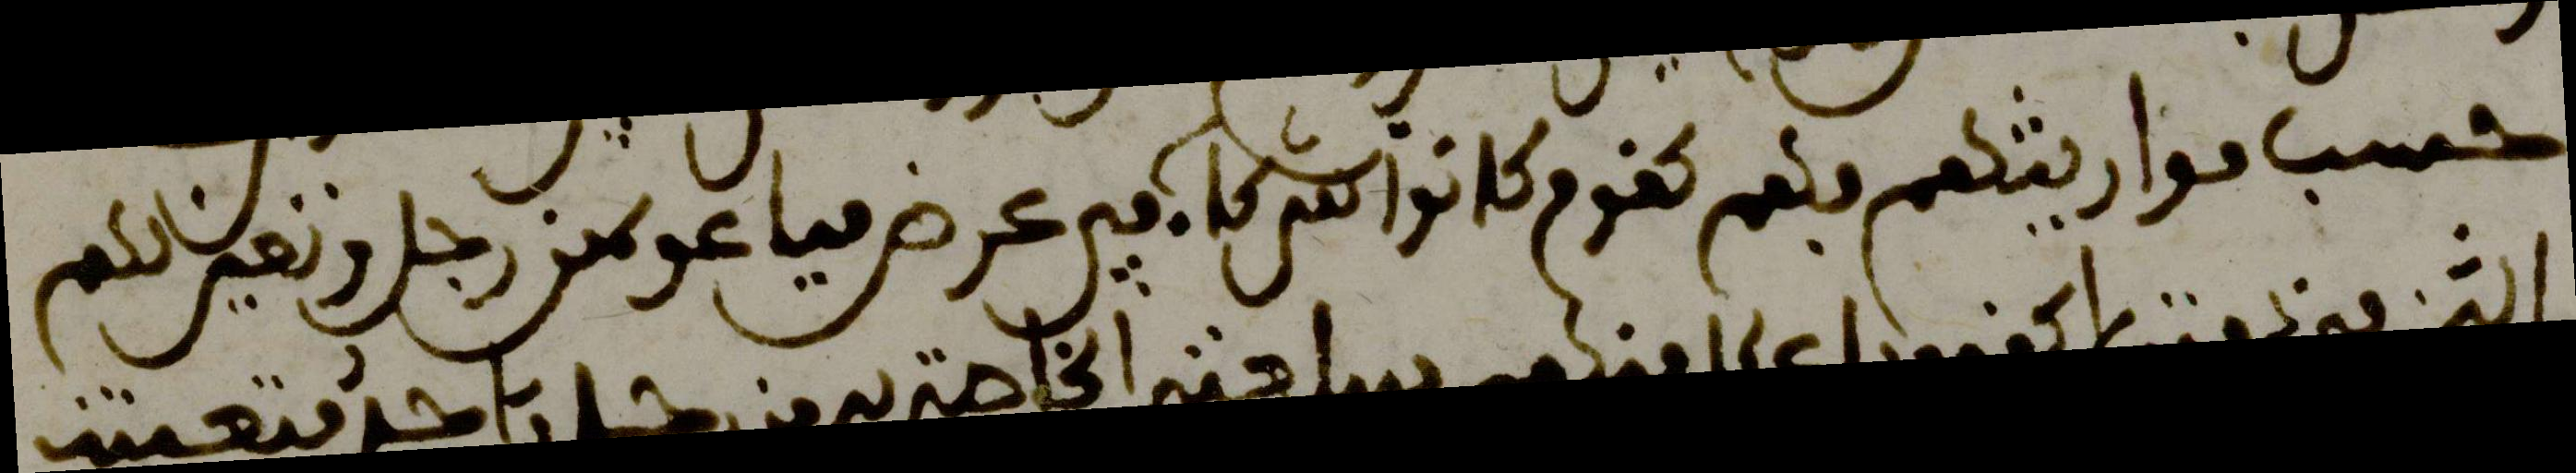حسب مواريثهم فهم كقوم كانوا شركاء في عرض فباعوه من رجل وتعين لهم
